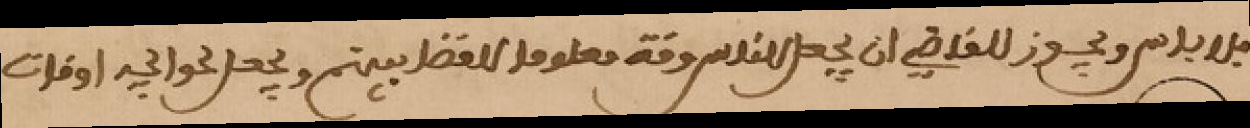فلا باس ويجوز للقاضي ان يجعل للناس وقت معلوما للقضا بينهم ويجعل # اوقات
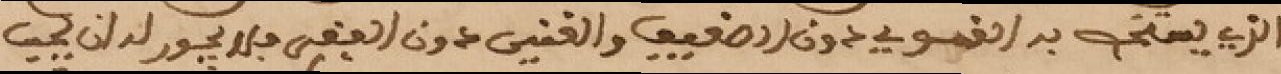الذي يستخص به القوي دون الضعيف والغني دون الفقير فلا يجوز له ان يجيب
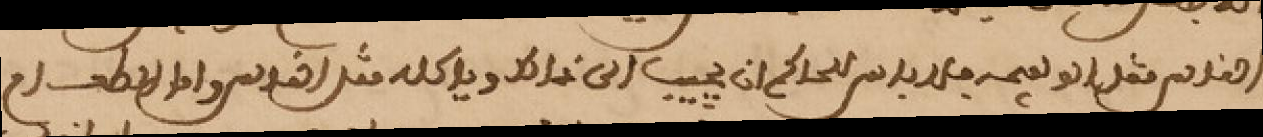الناس مثل الوليمة فلا باس للحاكم ان يجيب الى ذلك وياكله مثل الناس واما الطعام
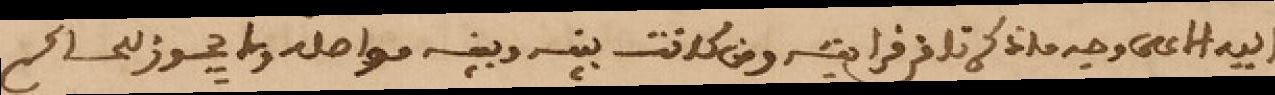اليه الا على وجه ما ذكرنا من قرابته ومن كانت بينه وبينه مواصله ولا يجوز للحاكم
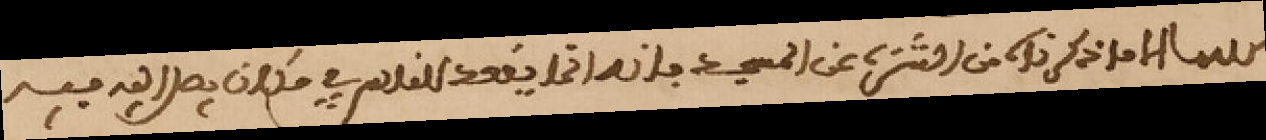كلها الا ما ذكرناه من الشىء عن المسجد فانه # يقعد للناس في مكان يصل اليه فيه
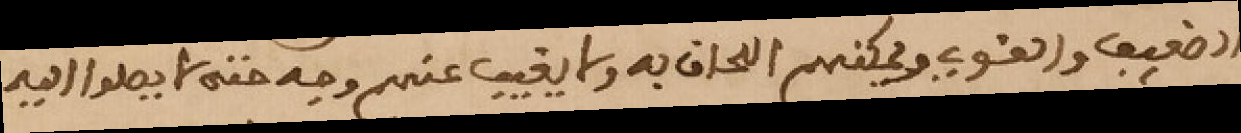الضعيف والقوي ويمكنهم اللحاق به ولا يغيب عنهم وجه حتى لا يصلوا اليه
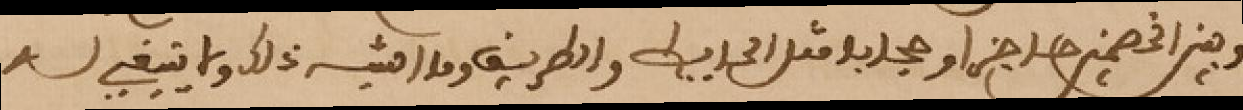وبين الخصمين حاجزا او حجابا مثل الحايط والطريق وما اشبه ذلك ولا ينبغي له
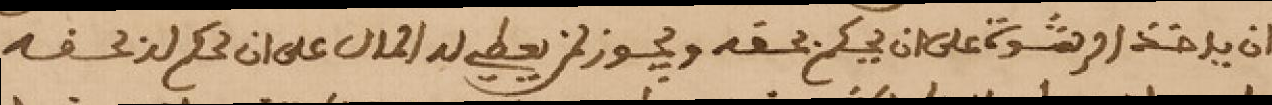ان ياخذ الرشوة على ان يحكم بحقه ويجوز لمن يعطي له المال على ان يحكم له بحقه
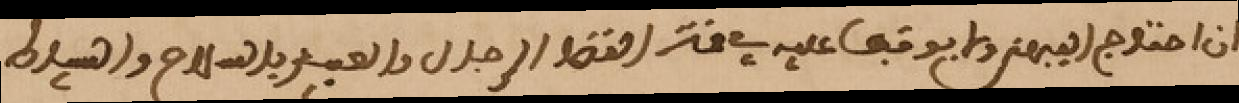ان احتاج اليهم ولا يوقف عليه في قمة القضا الرجال # بالسلاح والسوط
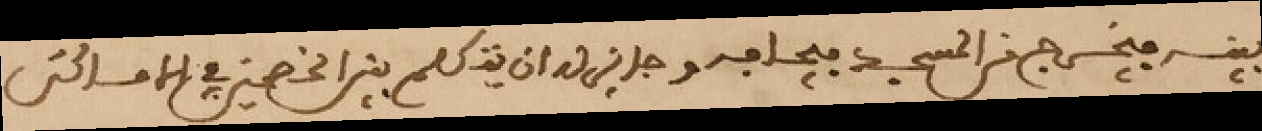بينة فيخرج من المسجد فيحافر وجايز له ان يتكلم بين الخصمين في الاماكن
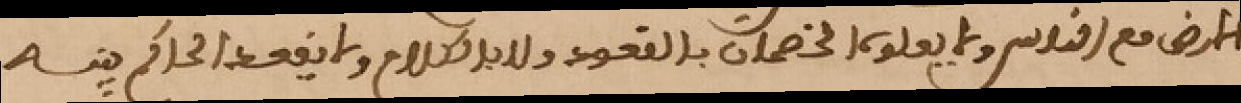الارض مع الناس ولا يعلوه الخصمان بالقعود ولا بالكلام ولا يقعد الحاكم بينه
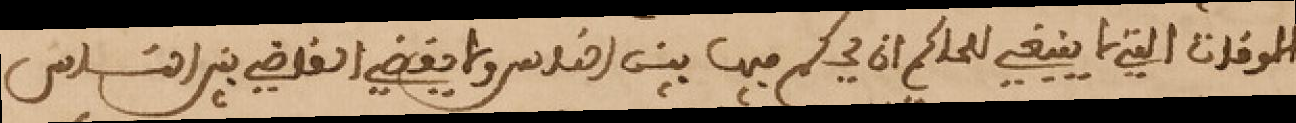الاوقات التي لا ينبغي للحاكم ان يحكم فيها بين الناس ولا يقضي القاضي بين الناس
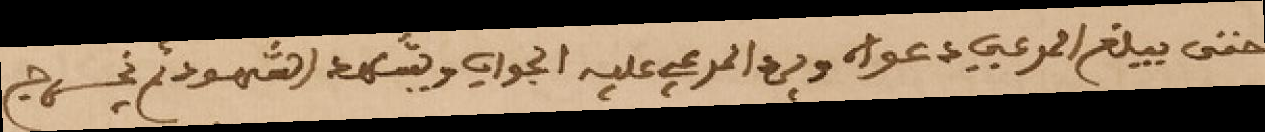حتى يبلغ المدعي دعواه ويرد المدعي عليه الجواب ويشهد الشهود ثم يخرج
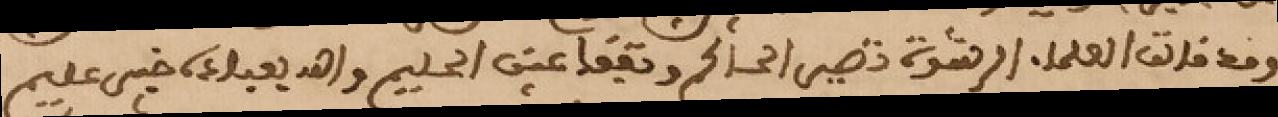وقد قالت العلماء الرشوة تصير الحاكم وتفقد عين الحكيم والله بعباده خبير عليهم
